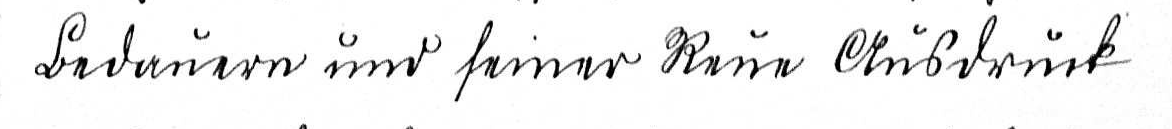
Bedauern und seiner Reue Ausdruck
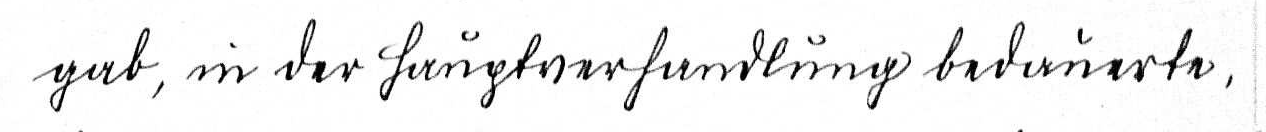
gab, in der Hauptverhandlung bedauerte,
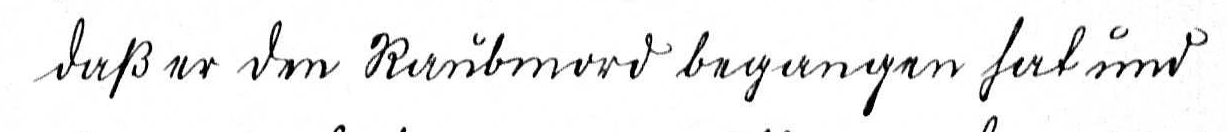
daß er den Raubmord begangen hat und
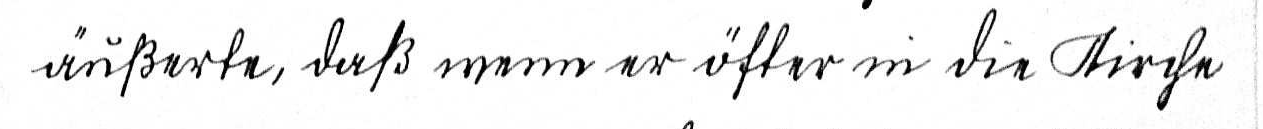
aüßerte, daß wenn er öfter in die Kirche
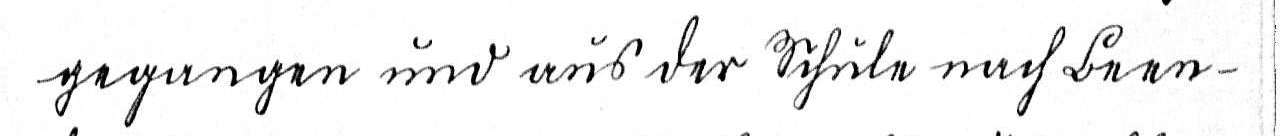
gegangen und aus der Schule nach Been¬
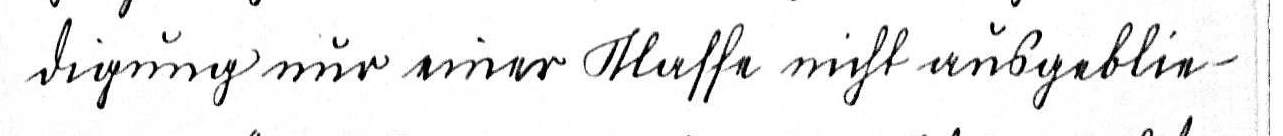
digung nur einer Klasse nicht ausgeblie¬
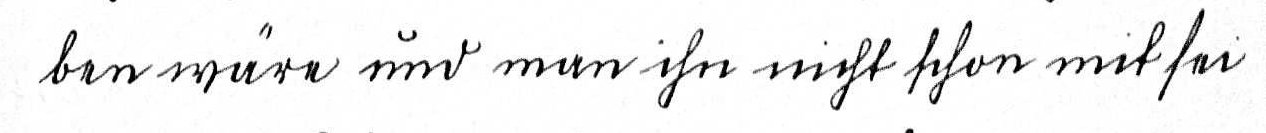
ben wäre und man ihn nicht schon mit sei¬
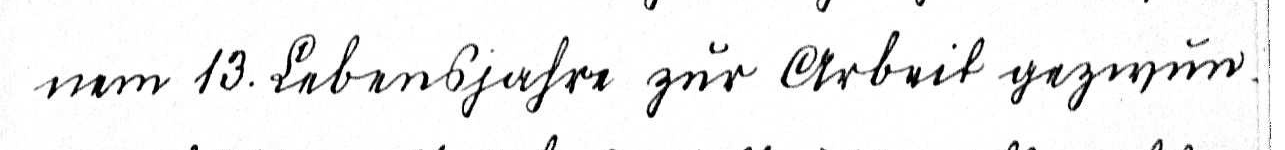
nem 13. Lebensjahre zur Arbeit gezwun¬
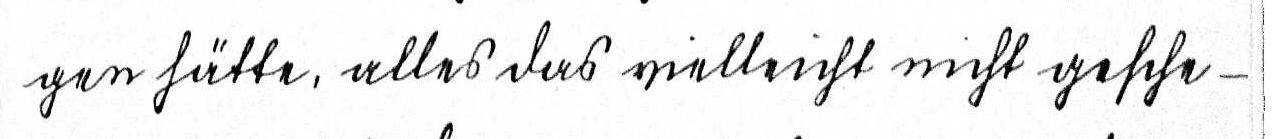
gen hätte, alles das vielleicht nicht gesche¬
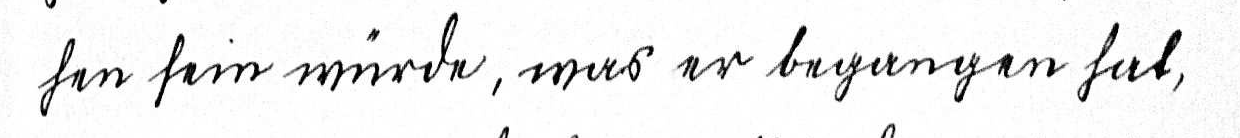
hen sein würde, was er begangen hat,
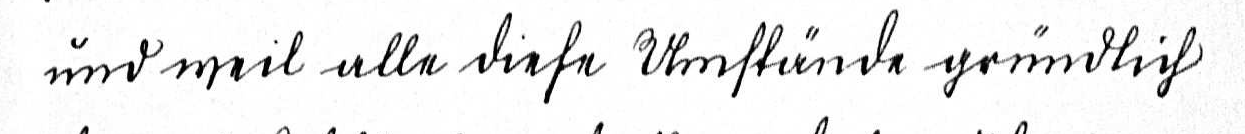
und weil alle diese Umstände gründlich
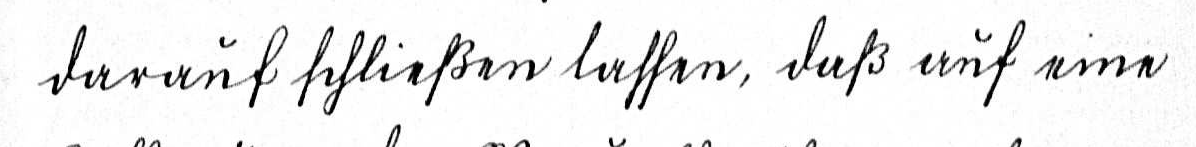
darauf schließen lassen, daß auf eine
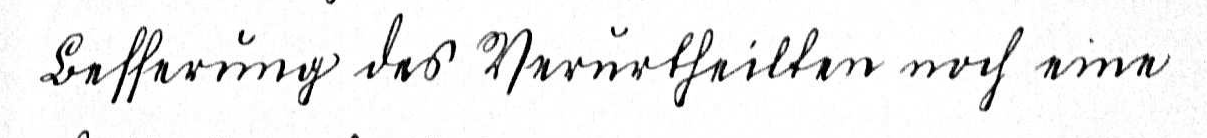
Besserung des Verurtheilten noch eine
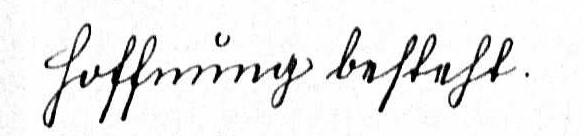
Hoffnung besteht.
